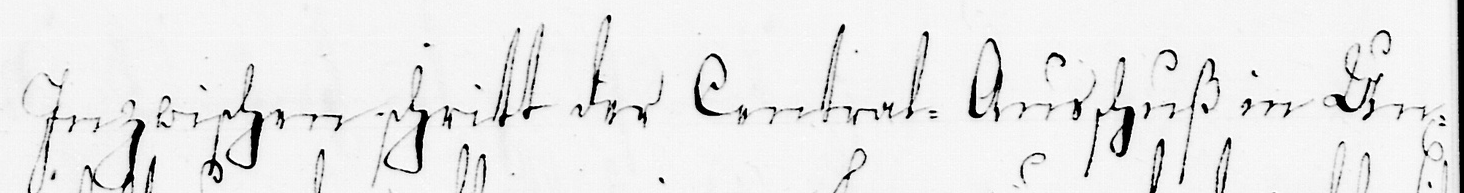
Inzwischen schritt der Central-Ausschuß in Un¬
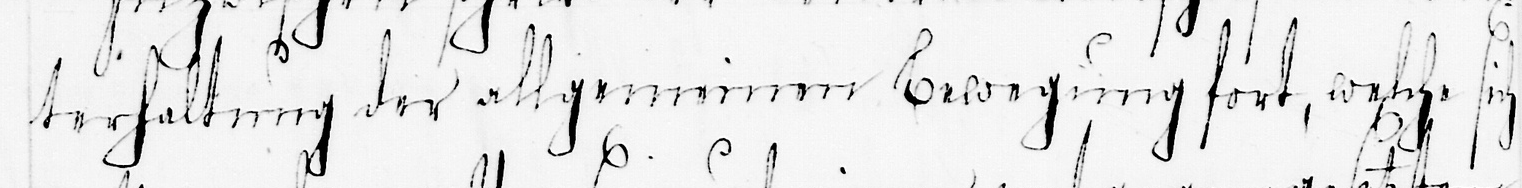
terhaltung der allgemeinen Bewegung fort, welche si¬
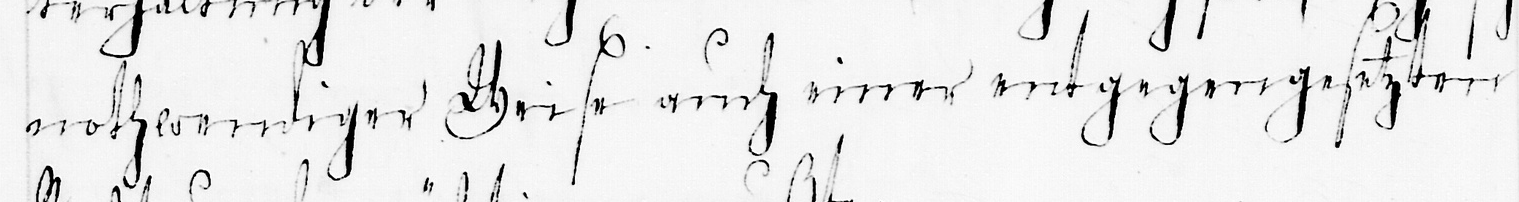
nothwendiger Weise auch einer entgegengesetzten
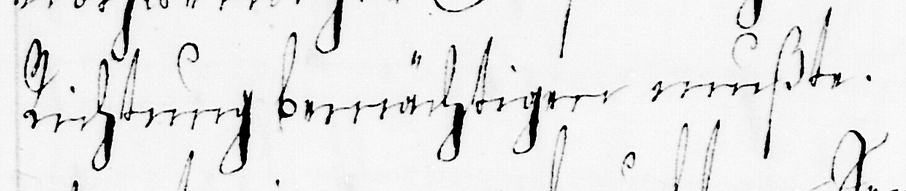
Richtung bemächtigen mußte.
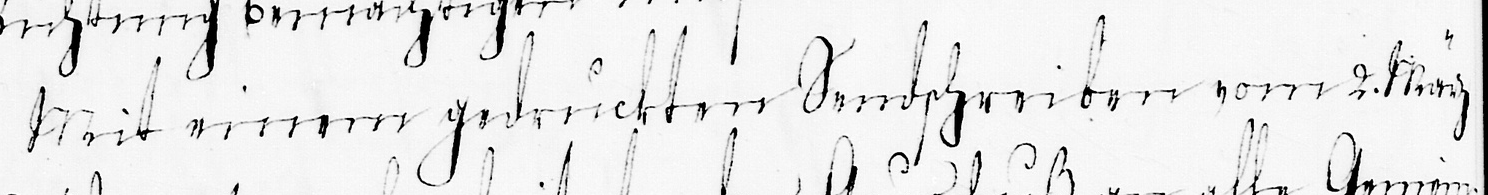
Mit einem gedruckten Sendschreiben vom 2. März
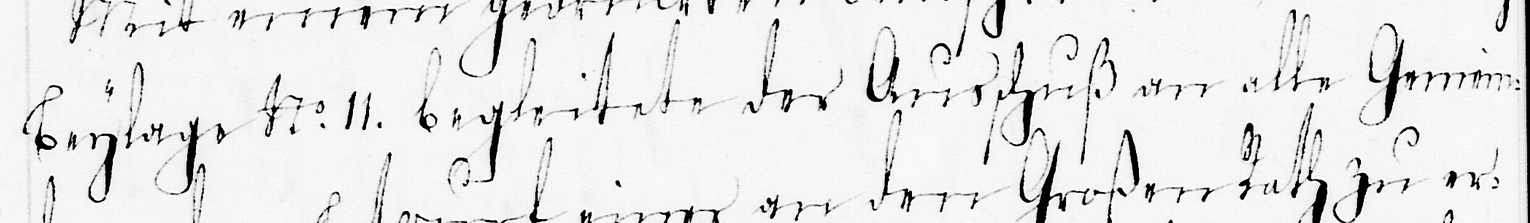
Beylage No. 11. begleitete der Ausschuß an alle Gemei¬
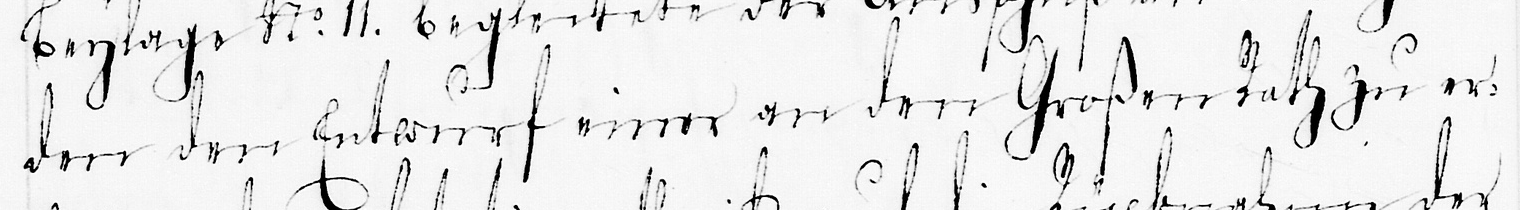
nden den Entwurf einer an den Großen Rath zu er¬
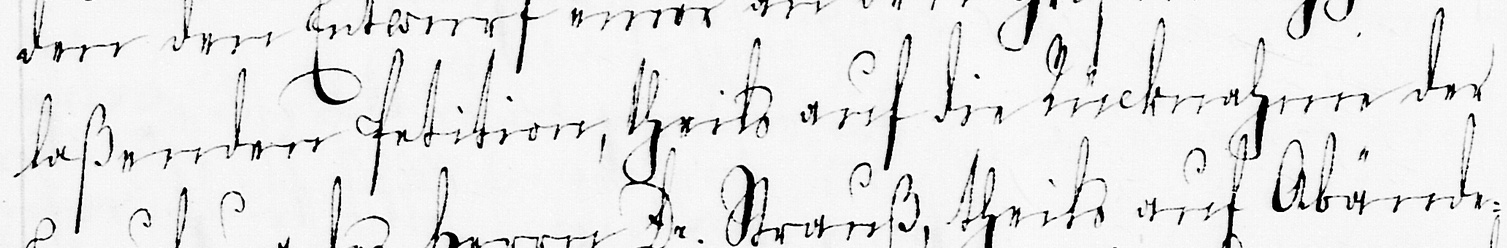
laßenden Petition, theils auf die Rücknahme der
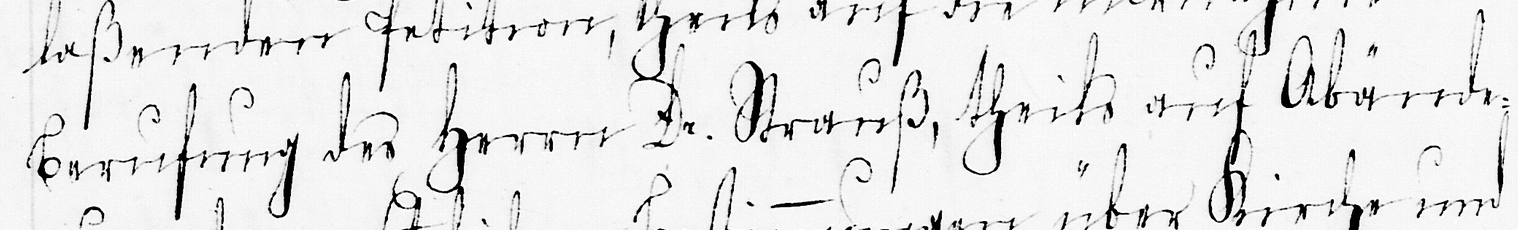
Berufung des Herrn Dr. Strauß, theils auf Abänd¬
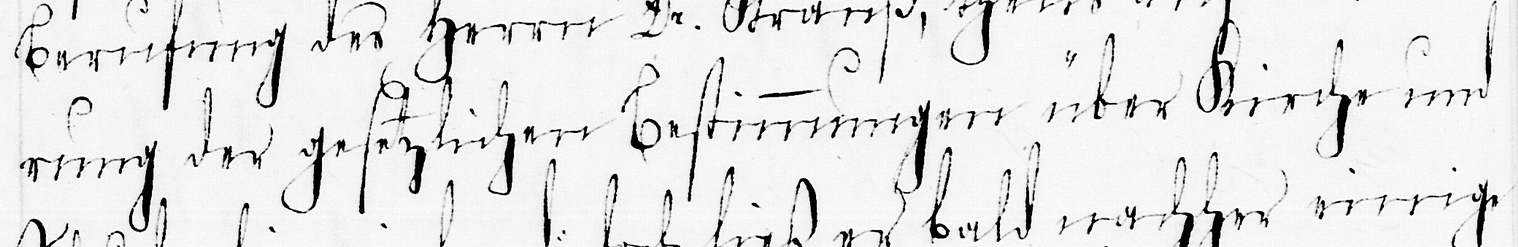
erung der gesetzlichen Bestimmungen über Kirche und
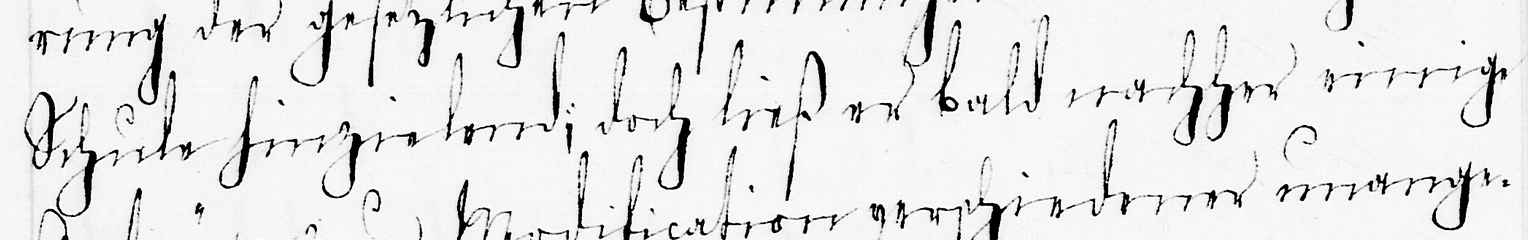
Schule hinzielend, doch ließ er bald nachher einige
